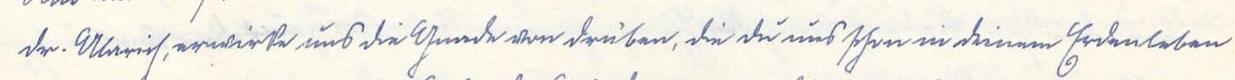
Dr. Alarich, erwirke uns die Gnade von drüben, die du uns schon in deinem Erdenleben
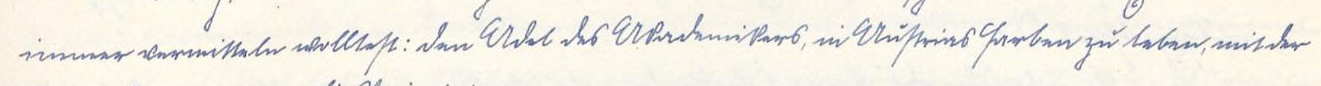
immer vermitteln wolltest: den Adel des Akademikers, in Austrias Farben zu leben mit der
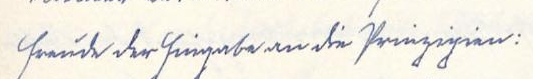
Freude der Hingabe an die Prinzipien:
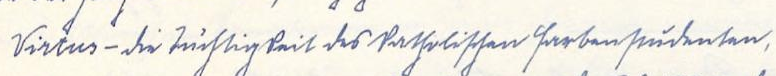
Virtus - die Tüchtigkeit der katholischen Farbenstudenten,
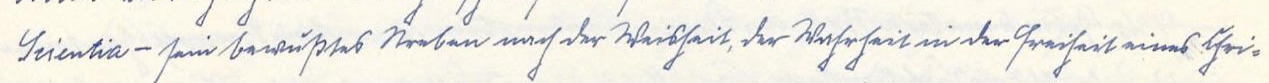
Scientia – sein bewusstes Streben nach der Weisheit, der Wahrheit in der Freiheit eines Chri-
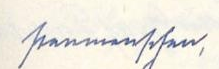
stenmenschen,
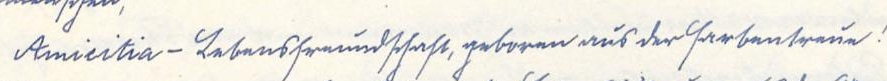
Amicitia - Lebensfreundschaft geboren aus der Farbentreue!
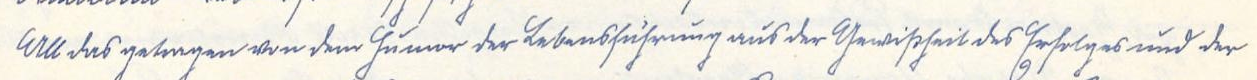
All das getragen von dem Humor der Lebensführung aus der Gewißheit des Erfolges und der
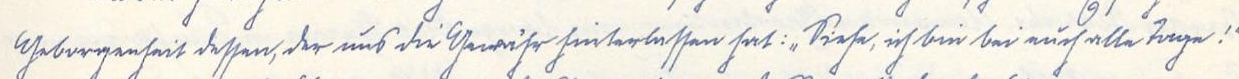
Geborgenheit dessen, der uns die Gewähr hinterlassen hat: „Siehe ich bin bei euch alle Tage!“
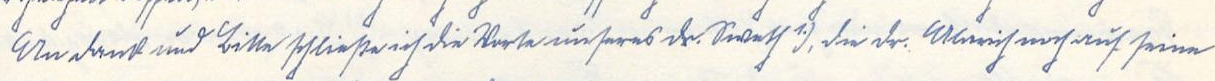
An Dank und Bitte schließe ich die Worte unseres Dr. Sweth 1) die Dr. Alarich noch auf seine
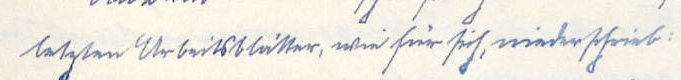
letzten Arbeitsblätter, wie für sich, niederschrieb:
